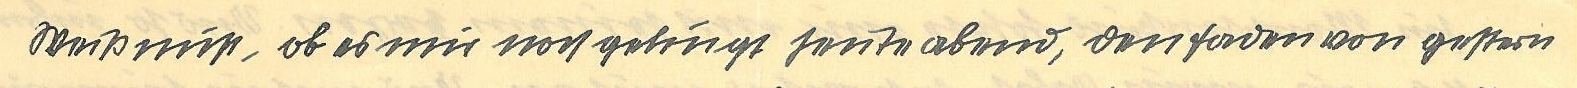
Weiß nicht, ob es mir noch gelingt heute abend, den Faden von gestern
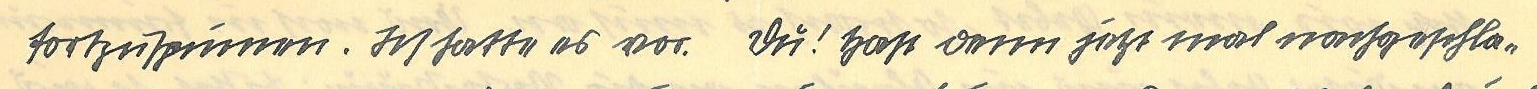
fortzuspinnen. Ich hatte es vor. Du! Hast denn jetzt mal nachgeschla¬
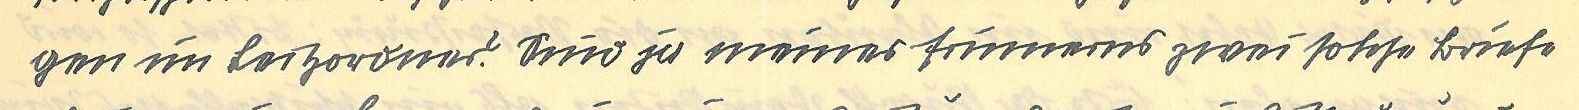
gen im Leitzordner? Sind ja meines Erinnerns zwei solche Briefe
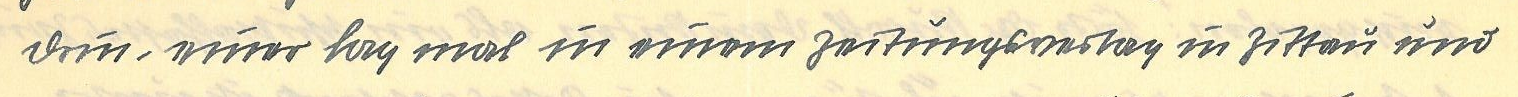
drin, einer lag mal in einem Zeitungsverlag in Z. und
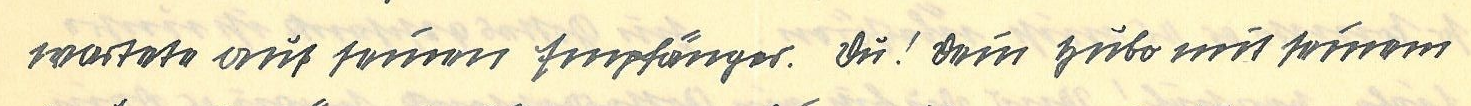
wartete auf seinen Empfänger. Du! Dein Hubo mit seinem
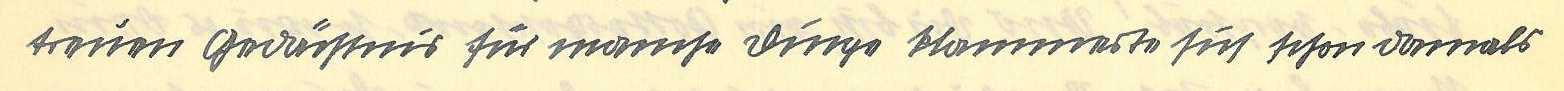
treuen Gedächtnis für manche Dinge klammerte sich schon damals
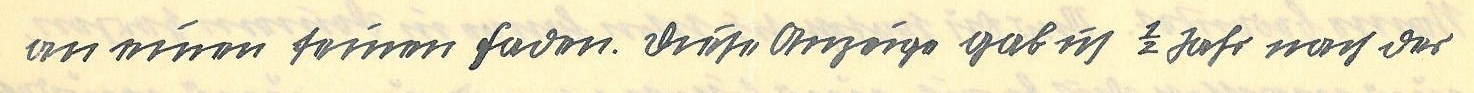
an einen feinen Faden. Diese Anzeige gab ich ½ Jahr nach der
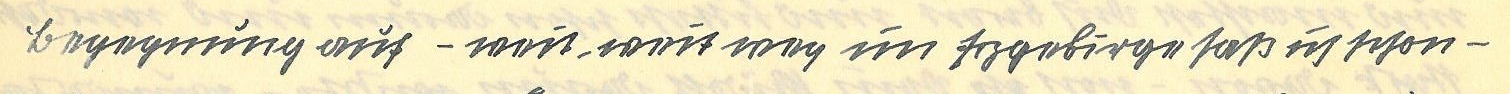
Begegnung auf – weit, weit weg im Erzgebirge saß ich schon –
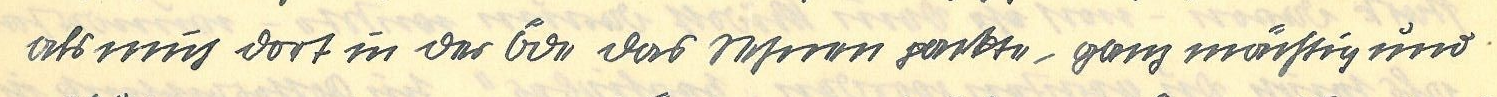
als mich dort in der Öde das Sehnen packte, ganz mächtig und
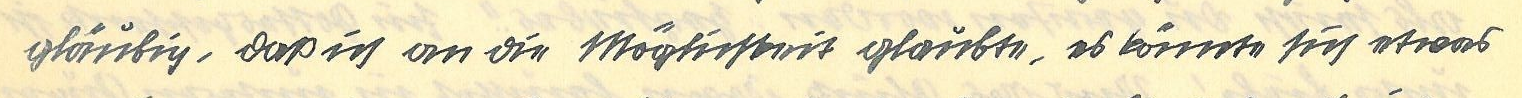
gläubig, daß ich an die Möglichkeit glaubte, es könnte sich etwas
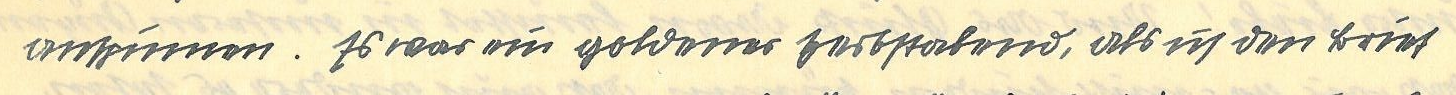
anspinnen. Es war ein goldener Herbstabend, als ich den Brief
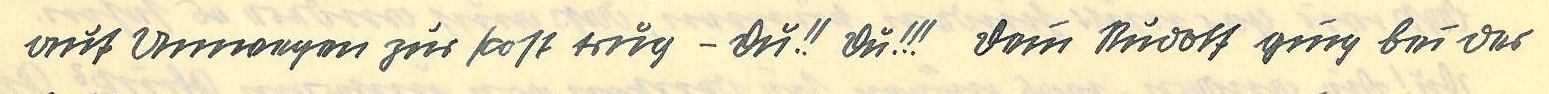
auf Umwegen zur Post trug – Du!! Du!!! Dein ging bei der
